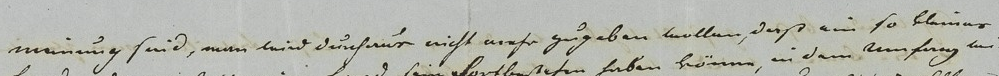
Meinung sind, man wird durchaus nicht mehr zugeben wollen, daß ein so kleines
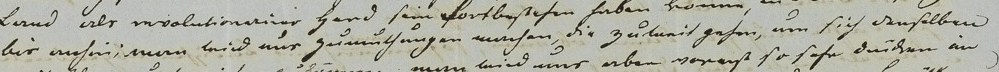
bis anhin; man wird uns Zumuthungen machen, die zu weit gehen, um sich denselben
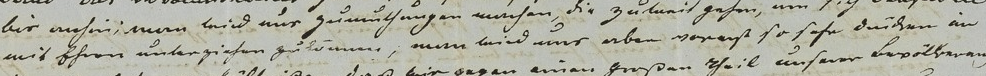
mit Ehren unterziehen zu können, man wird uns aber vorerst so sehr drücken an
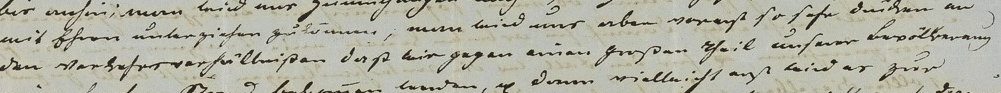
den Verkehrsverhältnißen daß wir gegen einen großen Theil unserer Bevölkerung
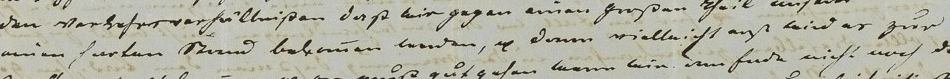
einen harten Stand bekommen werden, u dann vielleicht erst wieder zur
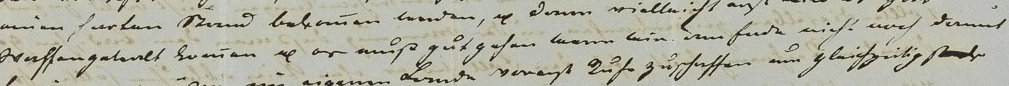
Waffengewalt kommen u es muß gut gehen wenn wir am Ende nicht noch damit
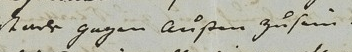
stark gegen Außen zu sein.
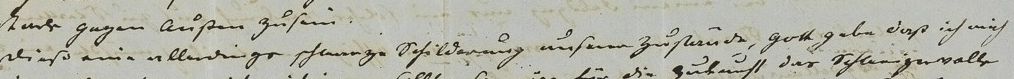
Dieß eine allerdings schwierige Schilderung unserer Zustände, Gott gebe daß ich mich
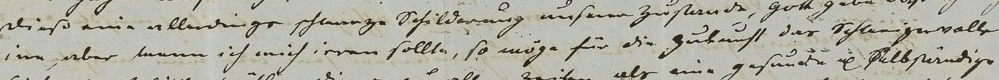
irre, aber wenn ich mich irren sollte, so möge für die Zukunft das Schweizervolk
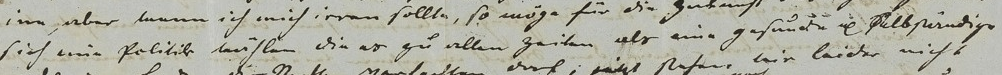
sich eine Politik wählen die es zu allen Zeiten als eine gesunde u selbständige
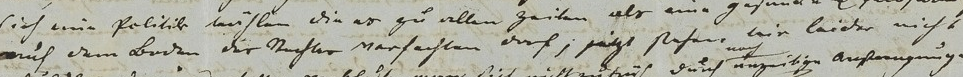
auf dem Boden des Rechtes verfechten darf; jetzt stehen wir leider nicht
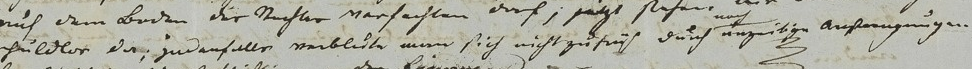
schuldlos da; jedenfalles verblute man sich nicht zu früh durch noch unzeitige Anstrengungen
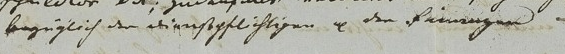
bezüglich der Dienstpflichtigen u der Finanzen.
